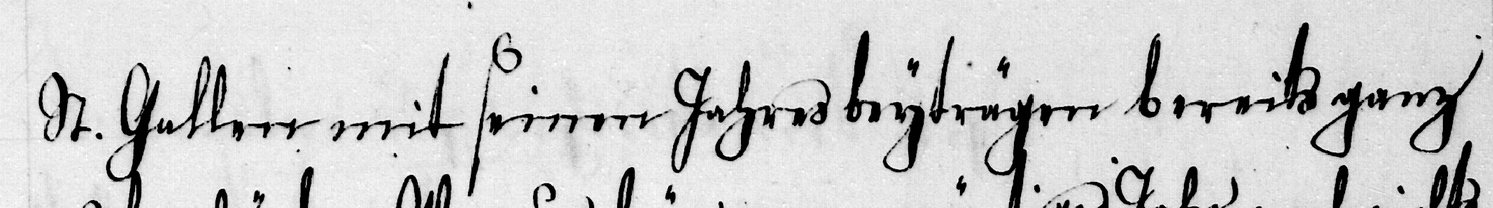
St. Gallen mit seinen Jahresbeyträgen bereits ganz
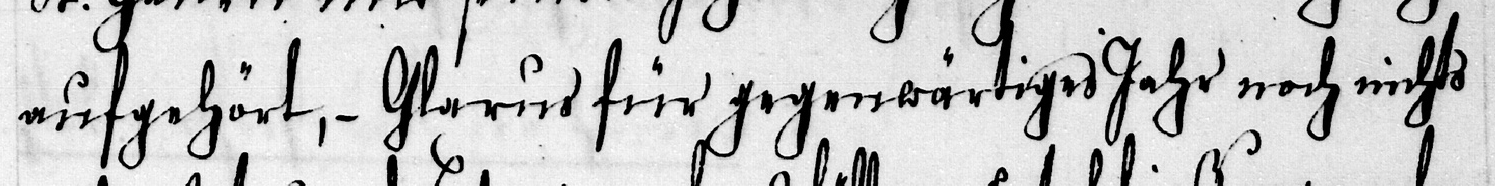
aufgehört, – Glarus für gegenwärtiges Jahre noch nichts
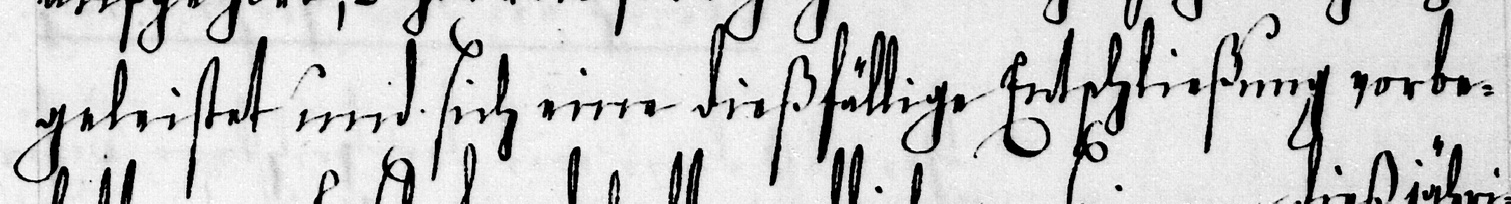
geleistet und sich eine dießfällige Entschließung vorbe¬
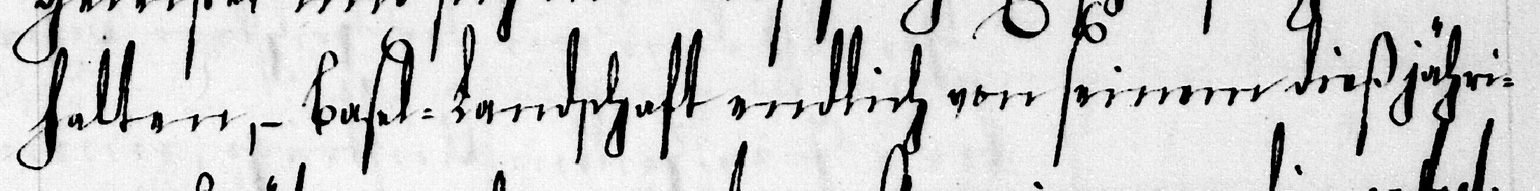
halten, – Basel-Landschaft endlich von seinem dießjähri¬
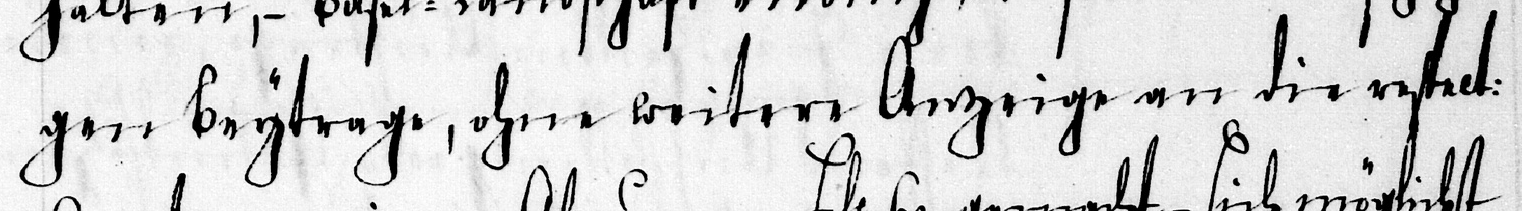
gen Beytrage, ohne weitere Anzeige an die respect:
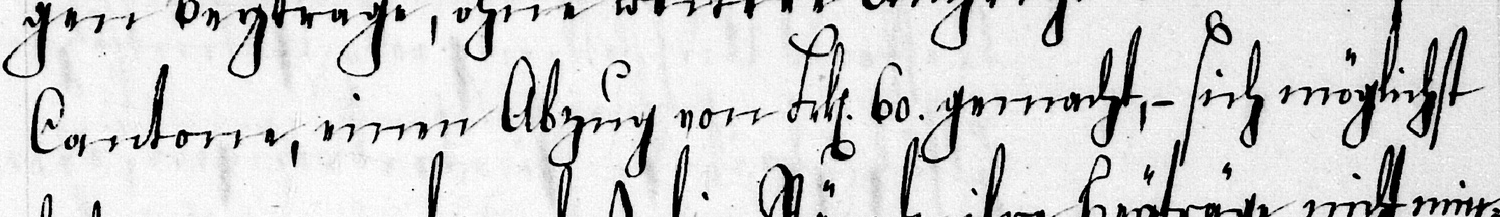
Cantone, einen Abzug von Frk[en]. 60. gemacht, – sich möglichst
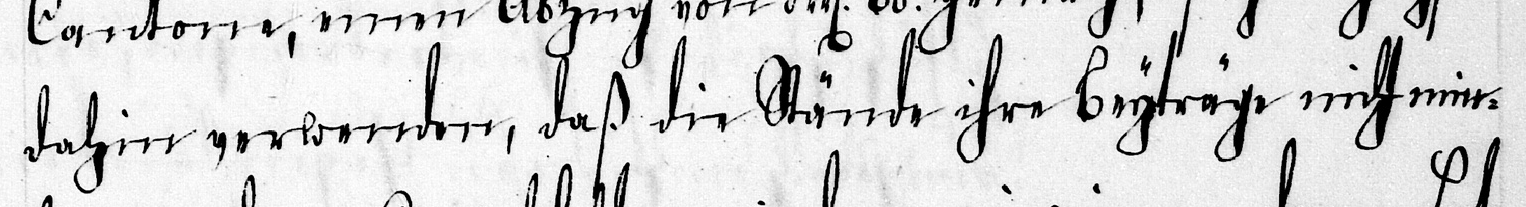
dahin verwenden, daß die Stände ihre Beyträge nicht min¬
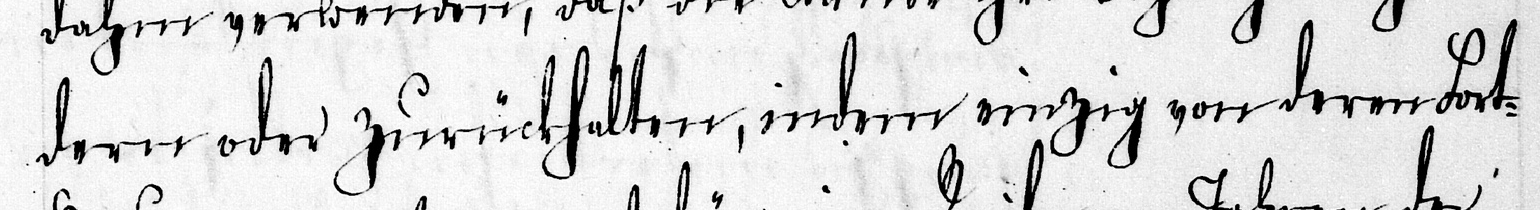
dern oder zurückhalten, indem einzig von deren Fort¬
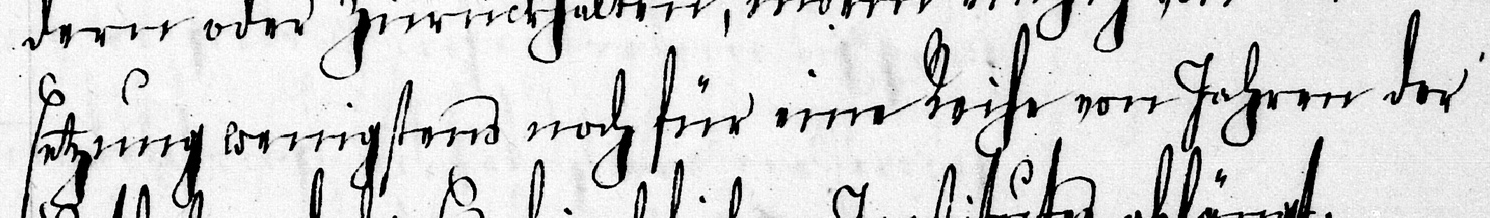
setzung wenigstens noch für eine Reihe von Jahren der
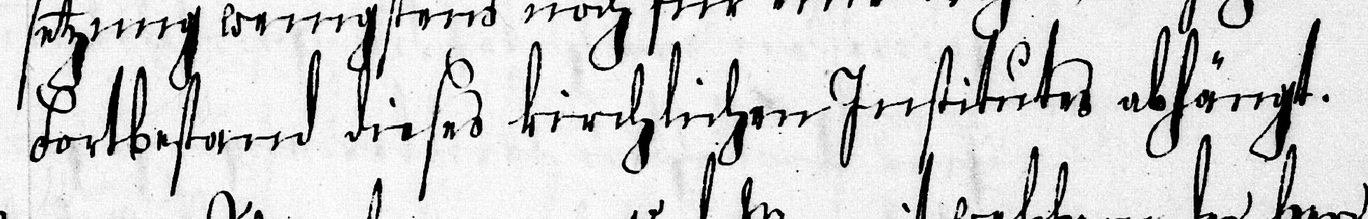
Fortbestand dieses kirchlichen Institutes abhängt.
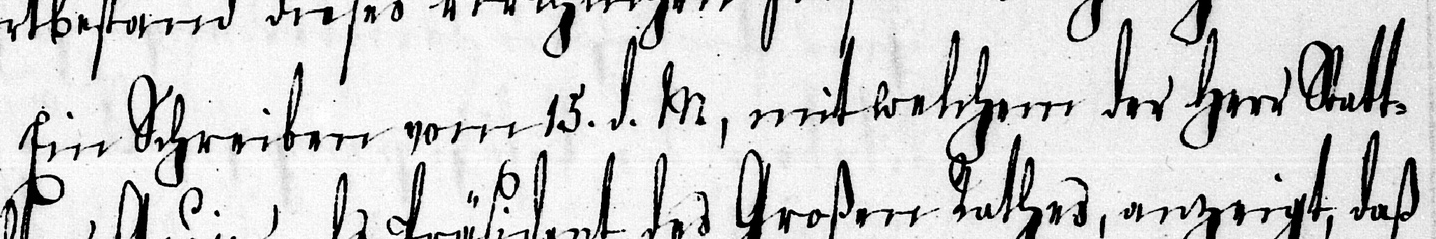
Ein Schreiben vom 15. d. M., mit welchem der Herr Sta¬
